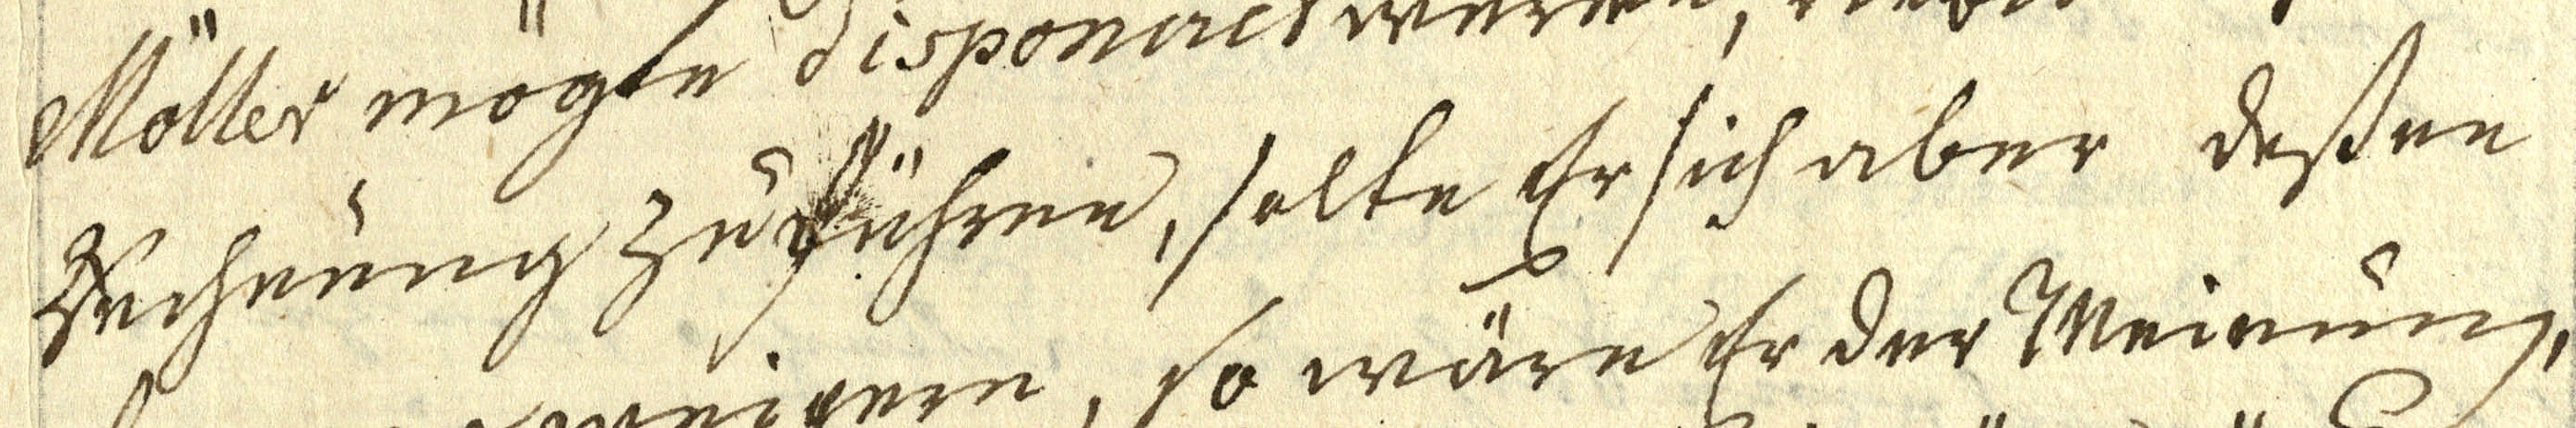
Rechnung zu führen, solte Er sich aber deßen
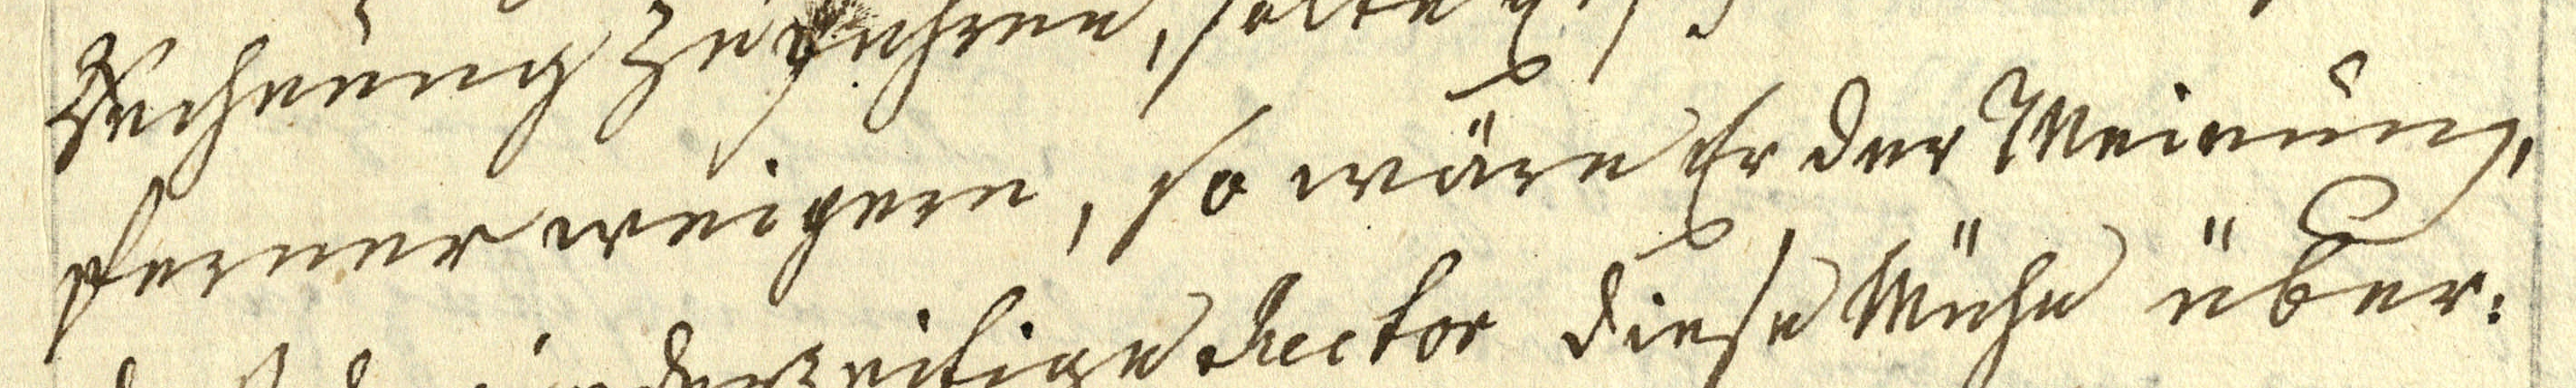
ferner weigern, so wäre Er der Meinung,
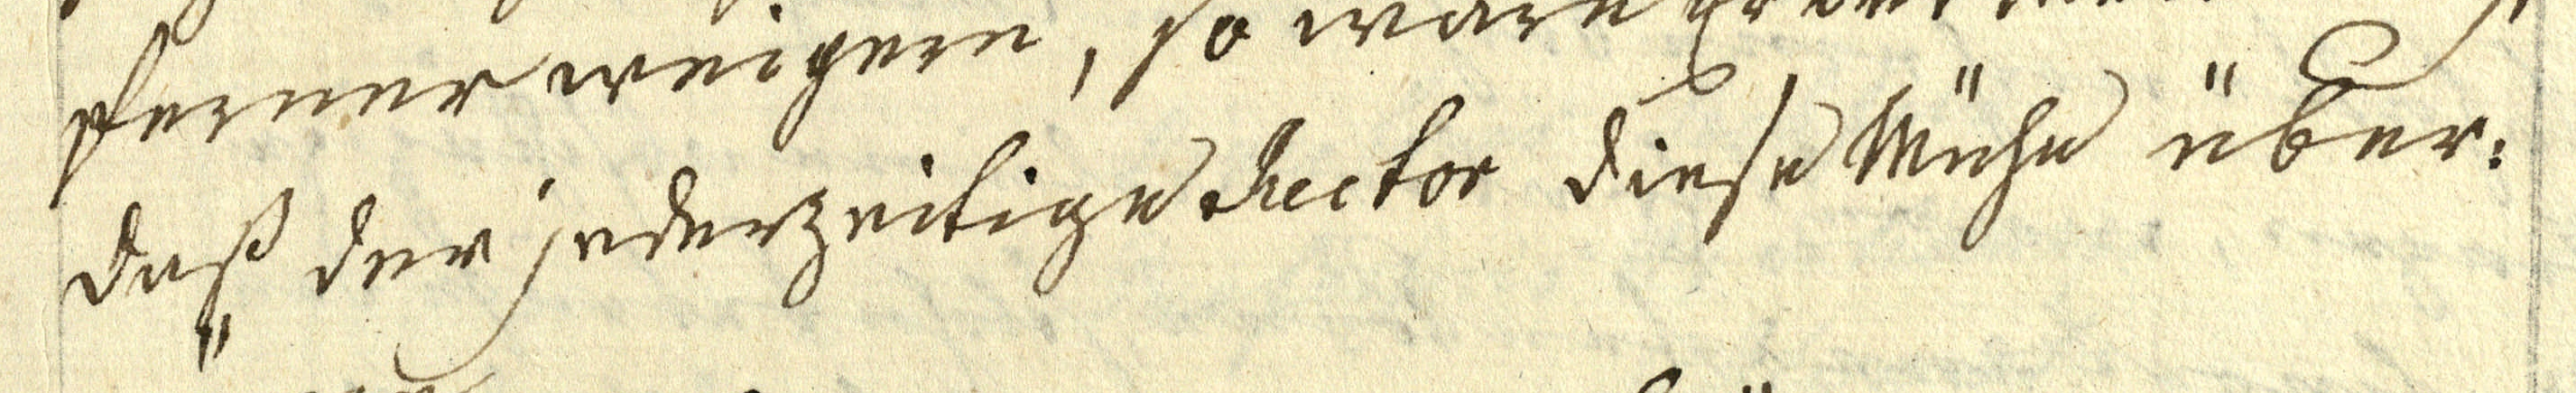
daß der jederzeitige Rector diese Mühe über¬
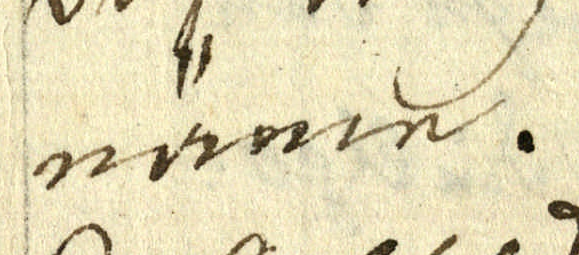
näme.
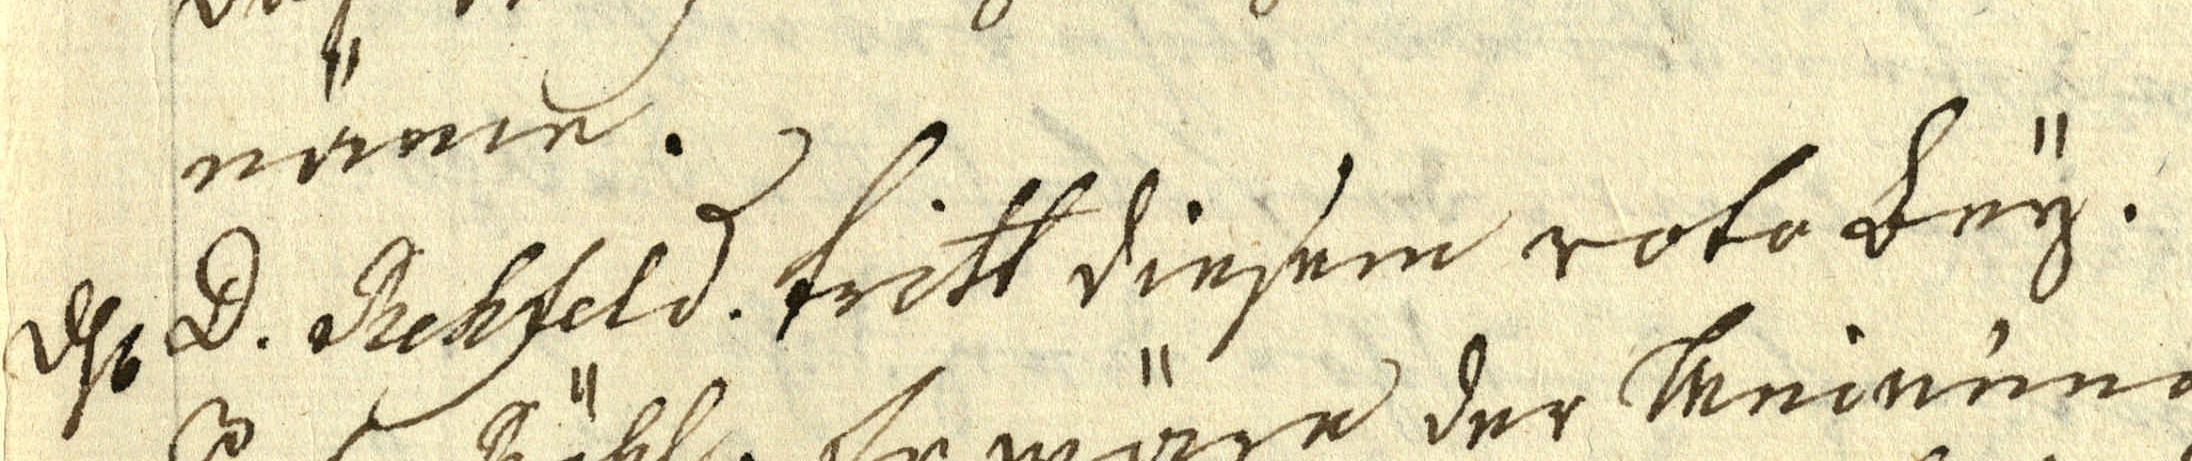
dh. D. Rehleld tritt diesem voto beÿ.
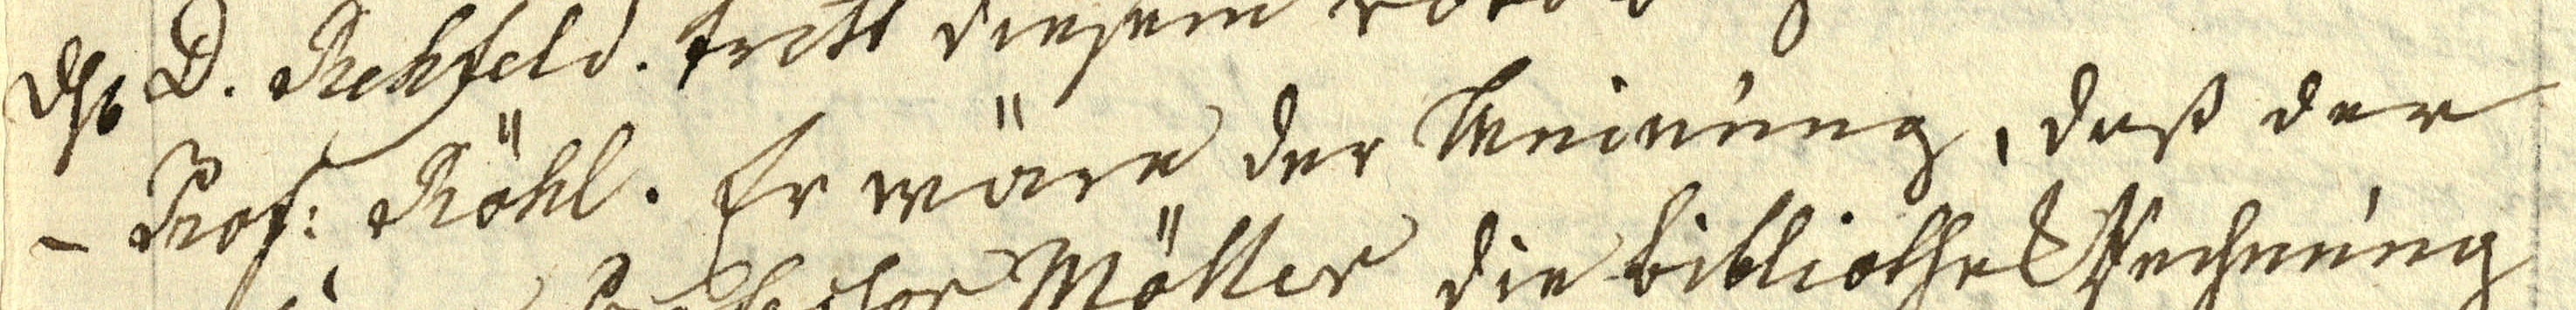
Prof. Röhl. Er wäre der Meinung, daß der
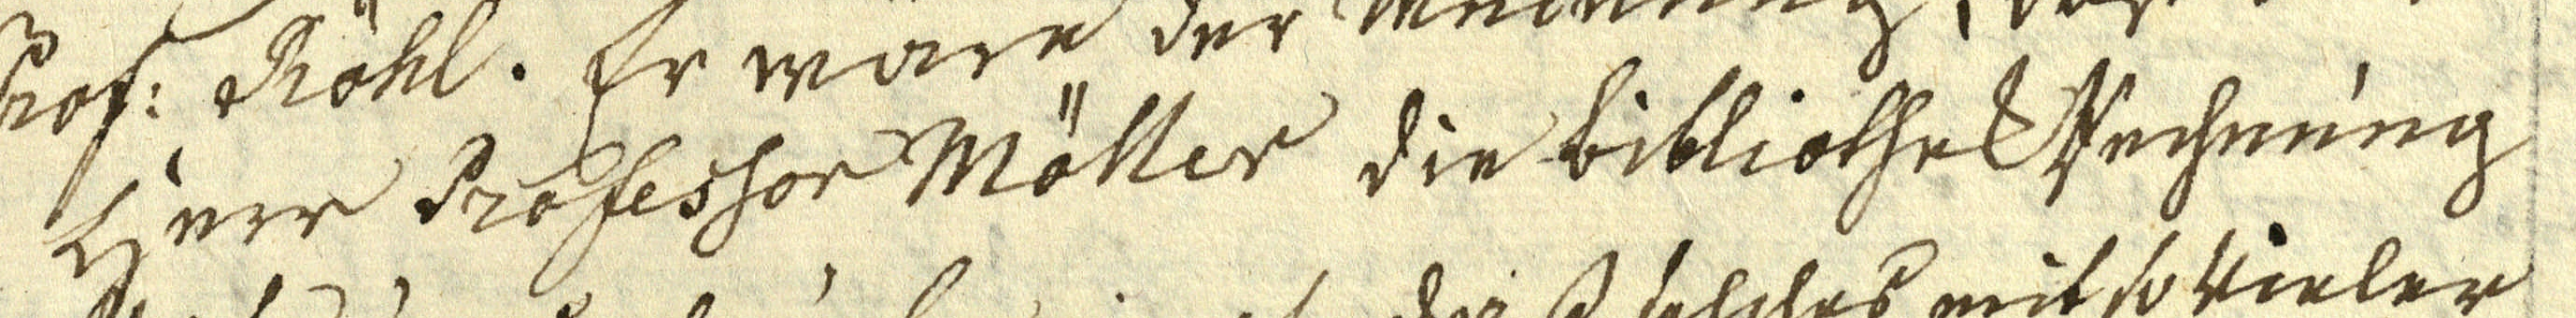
Herr Professor Möller die Bibliothek Rechnung
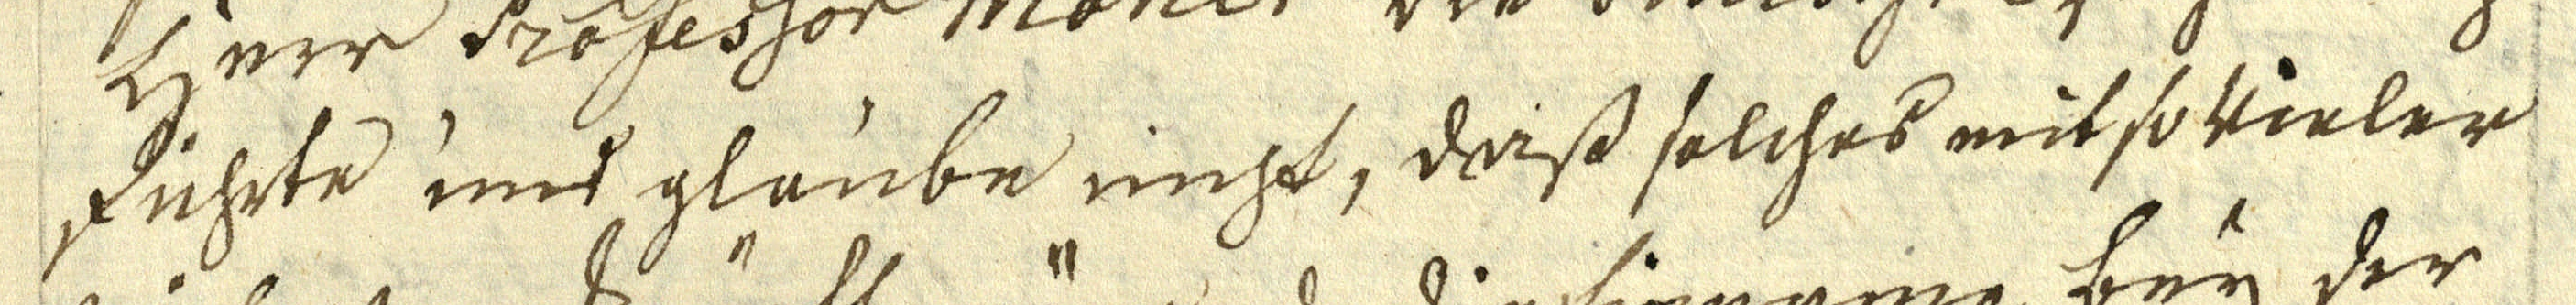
führte und glaube nicht, daß solches mit so vieler
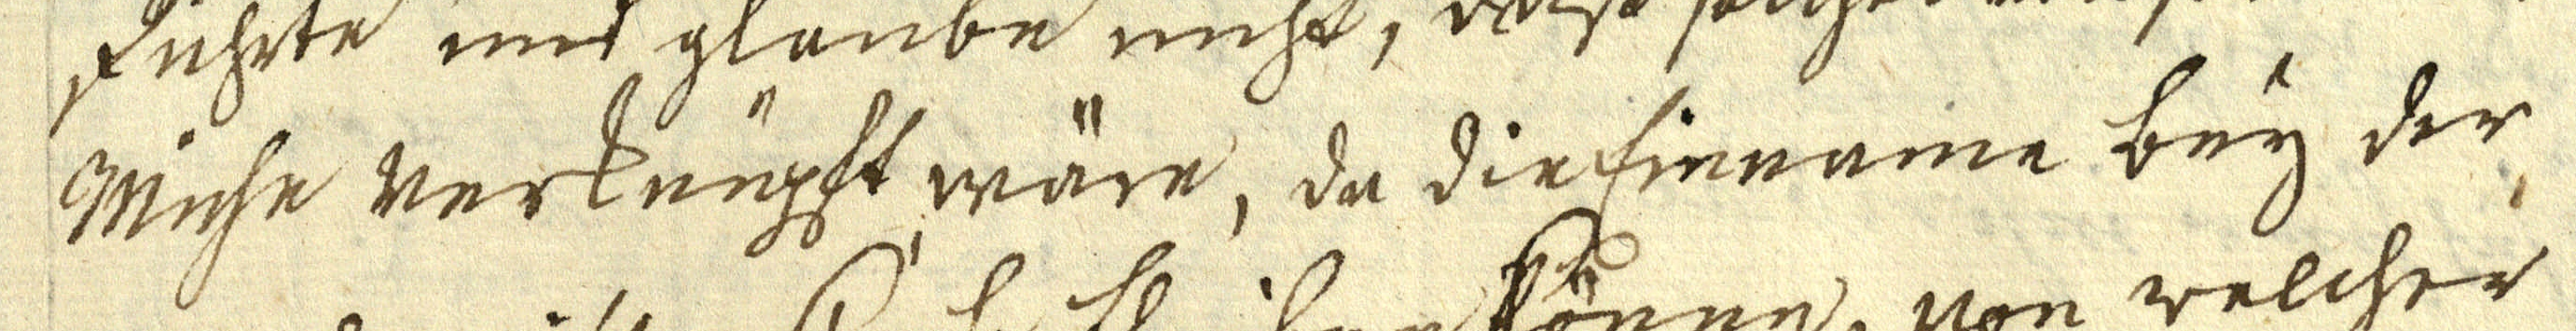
Mühe verknüpft wäre, da die Einname beÿ der
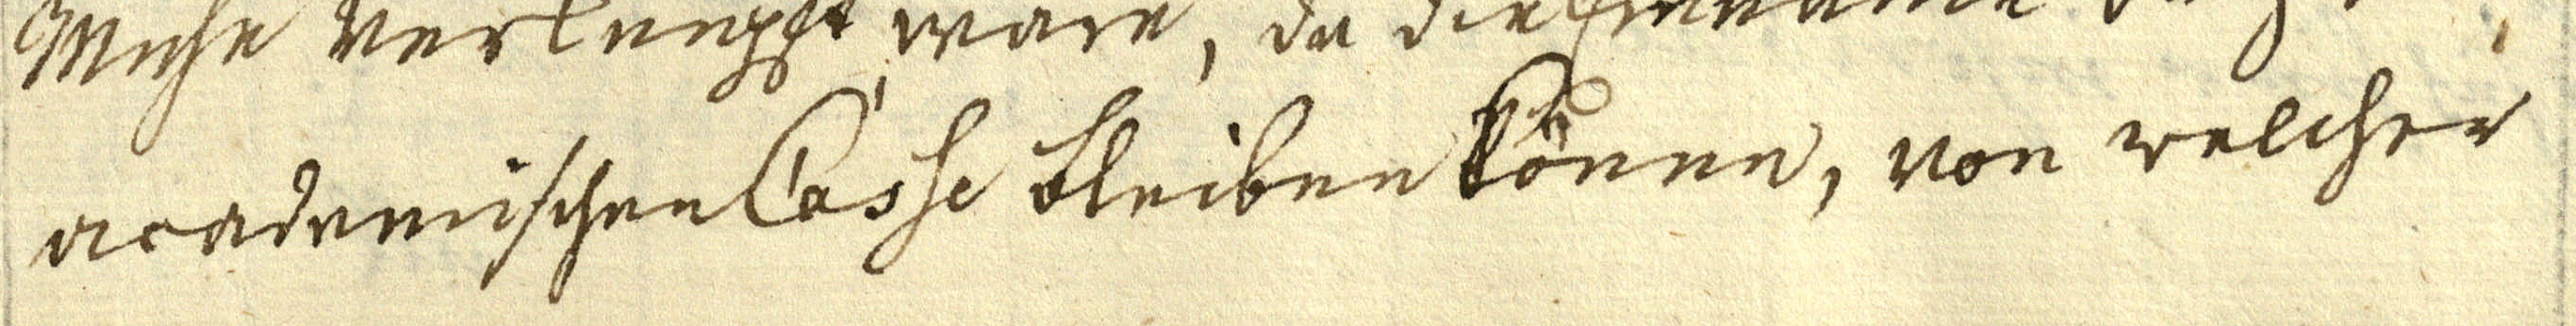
academischen Casse bleiben könne, von welcher
